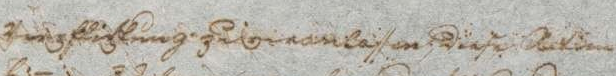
Verpflichtung zu veranlassen, diese Actien
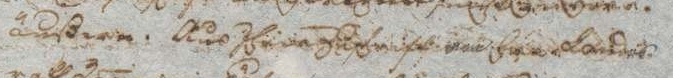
äußern. Aus Ihrer Zuschrift an Herrn Landes-
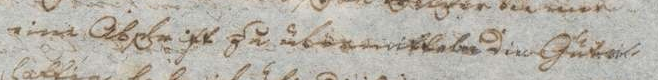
eine Abschrift zu übermitteln die Güte
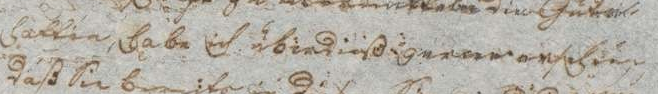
hatten, habe ich überdieß gerne ersehen,
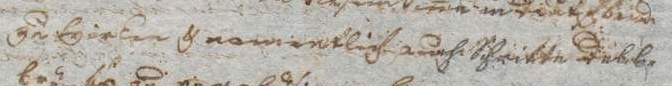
zu wirken & namentlich auch Schritte Delb-
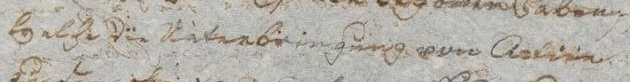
welche die Unterbringung von Actien
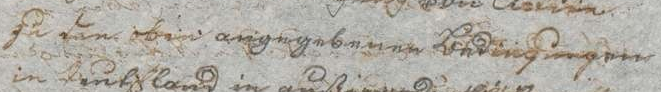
zu den oben angegebenen Bedingungen
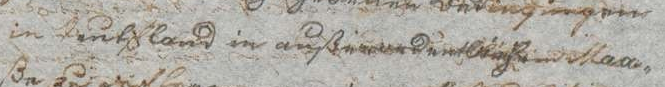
in Deutschland in außerordentlichem Maa-
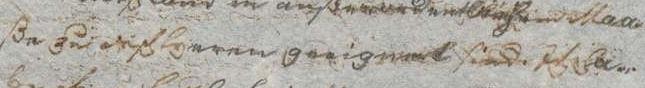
ße zu erschweren geeignet sind. Ich ha-
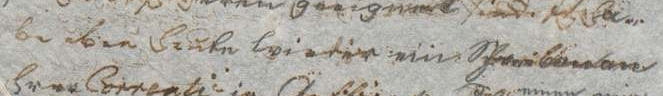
be eben heute wieder ein Schreiben an
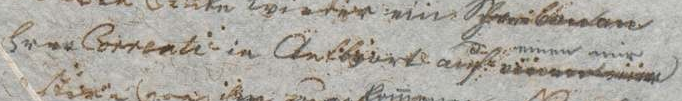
Herrn Correnti in Antwort auf einen mir
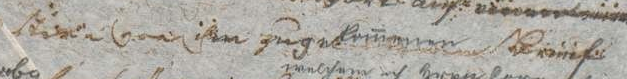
gestern von ihm zugekommenen Brief
